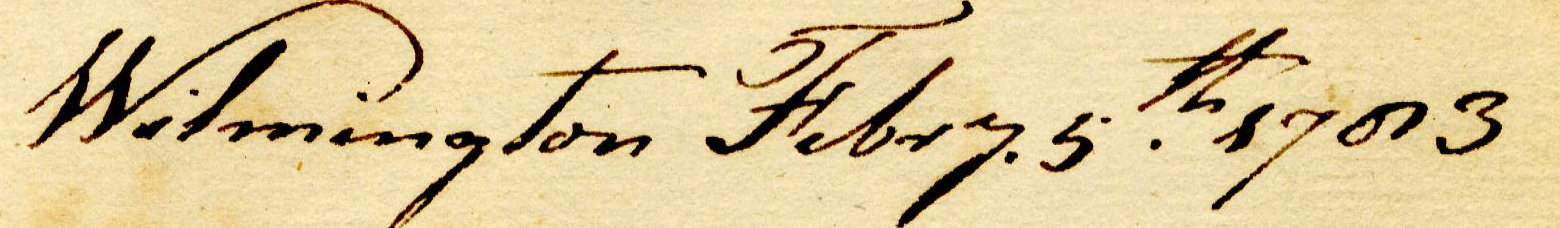Wilmington Febry 5^th 1783
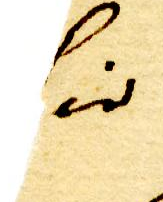Sir
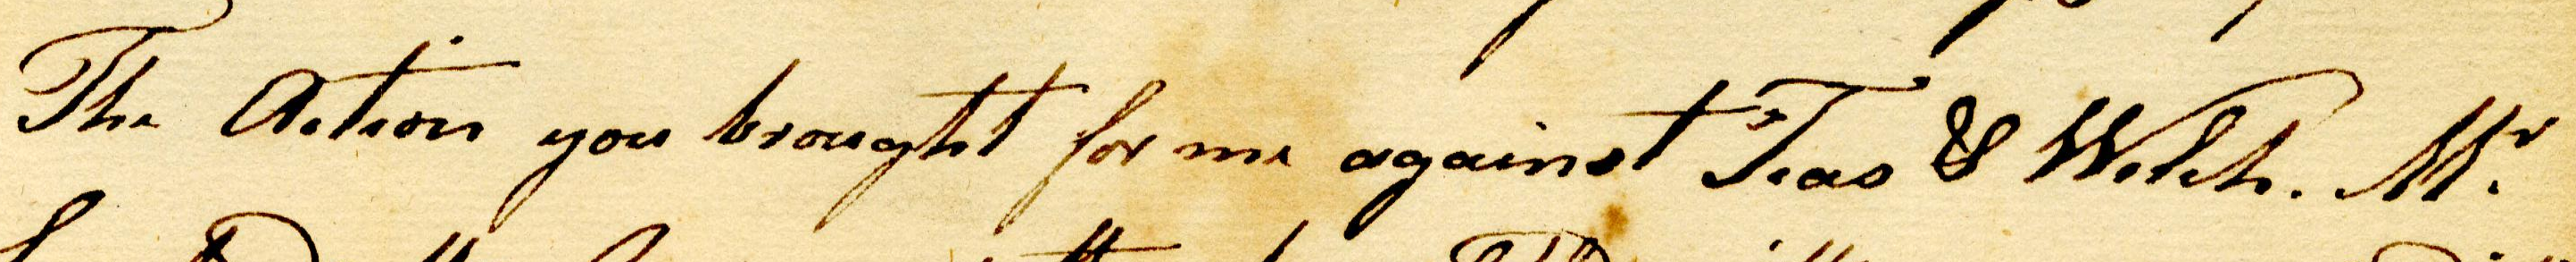The Action you brought for me against Teas & Watch. M^r.
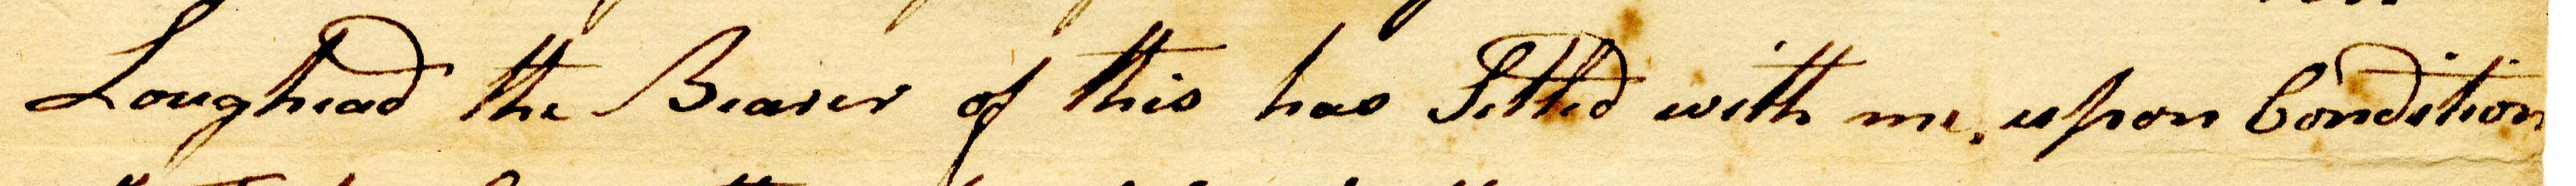Loughead the Beaser of this has setled with me, upon Condition
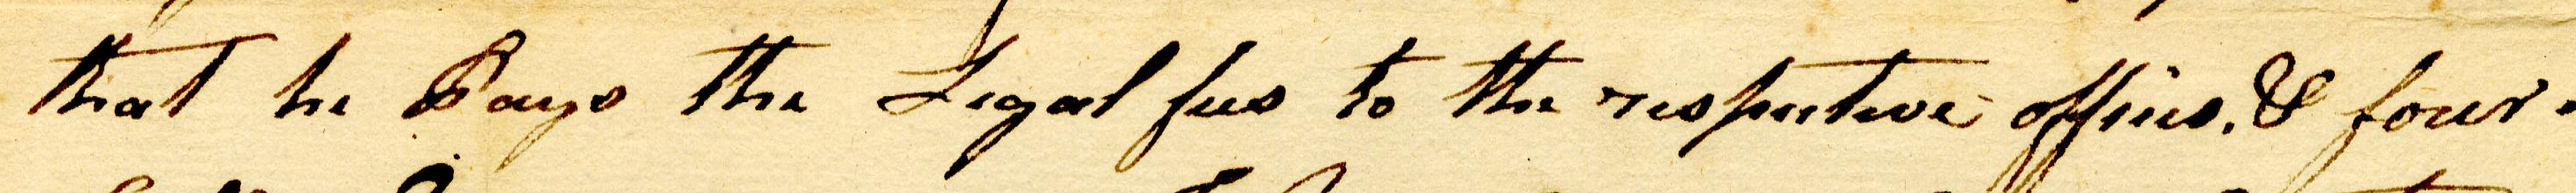that he Pays the Legal fees to the respective offices, & four
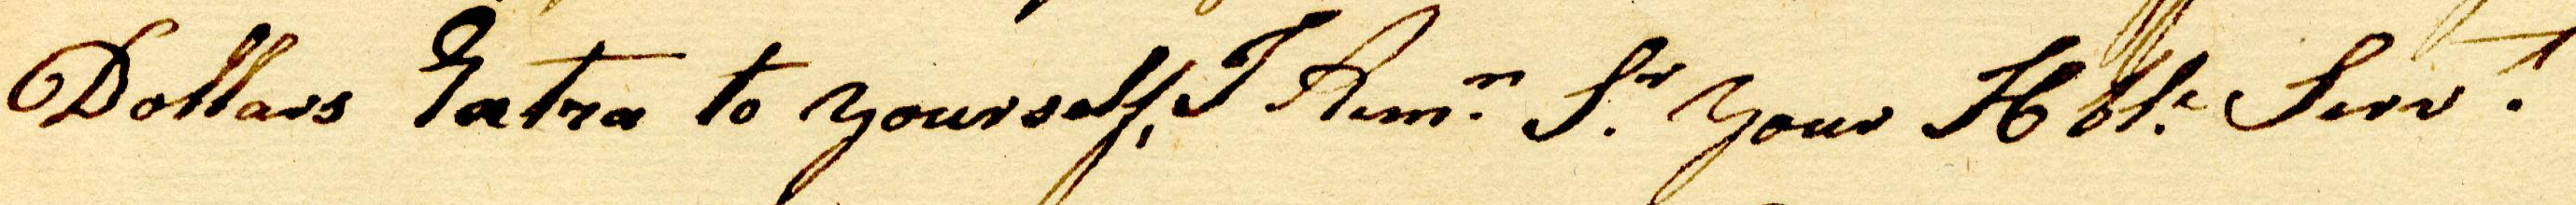Dollars Extra to yourself, I Am^r. S^ir. Your Hbl^e. Serv^t.
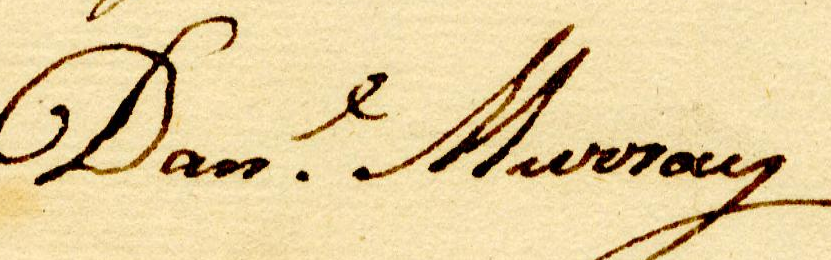Dan^l. Murray
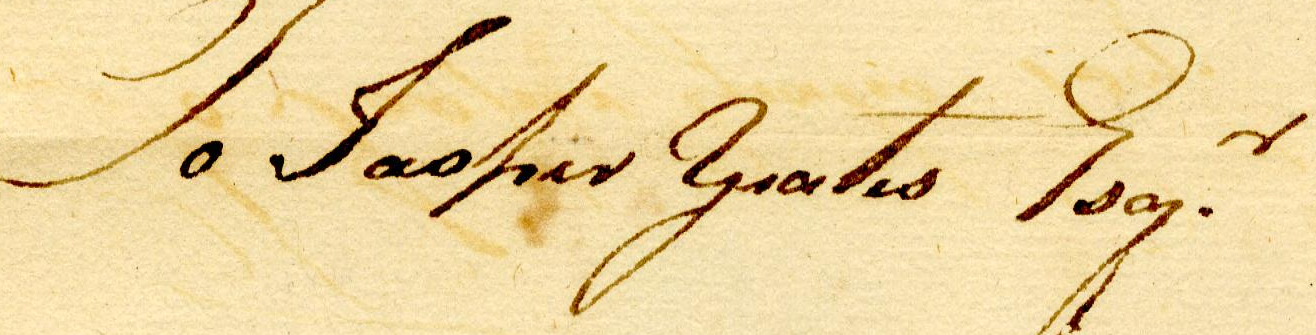To Jasper Yeates Esq^r
